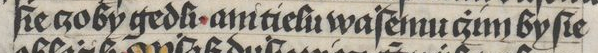ẛie czo by gedli.ani tielu waẛemu cżím by ſie
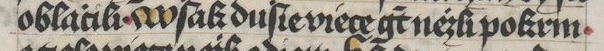oblaċili.Wẛak duẛie víece ḡt neżli pokrm.
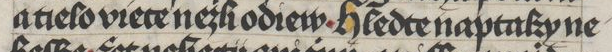a tielo viece neżli odiew.Hledte naptaky ne¬
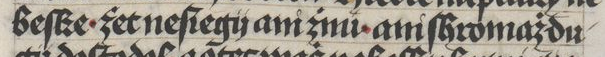beſke.żet neſlegij ani żnu.ani ſhromażdu¬
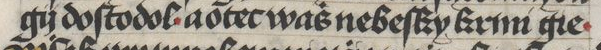gij doſtodol.a otec waṡ nebeſky krmi gie.
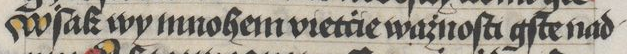Wẛak wy mnohem vietċie ważnoſti gſte nad
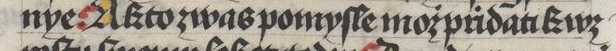nye?A kto zwas pomyſle moż pṙidati kwz¬
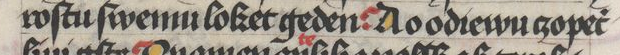roſtu ſwemu loket geden?A o odiewu czopeċ
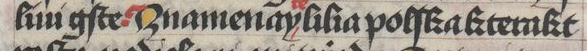liui gſte?Znamenayte lilia polſka kterakt
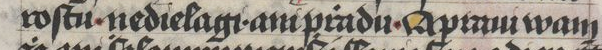roſtu.nedielagi.ani pṙadu.A praui wam
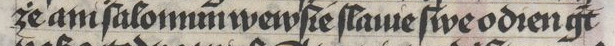że ani ẛalomun wewẛie ſlauie ſwe odien ḡt
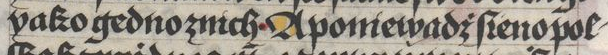yako gedno znich.A poniewadż ſieno pol¬
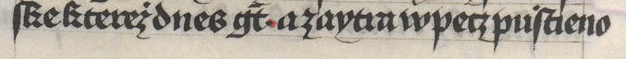ſke ktereż dnes ḡt.a zaytra wpecz puẛtieno
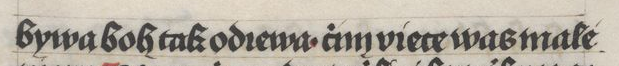bywa boh tak odiewa.ċim víece was malé
